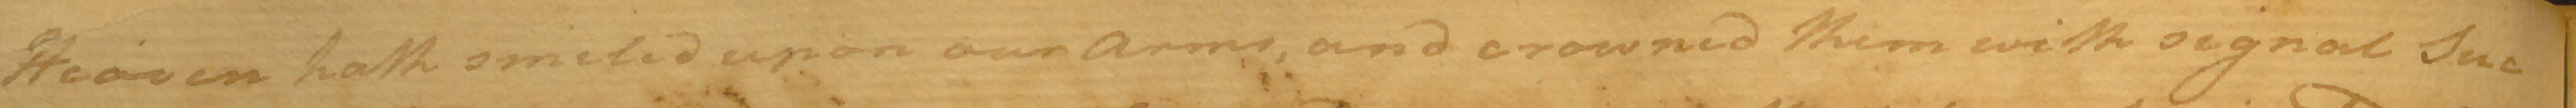Heaven hath smiled upon our Arms and crowned them with signal Suc
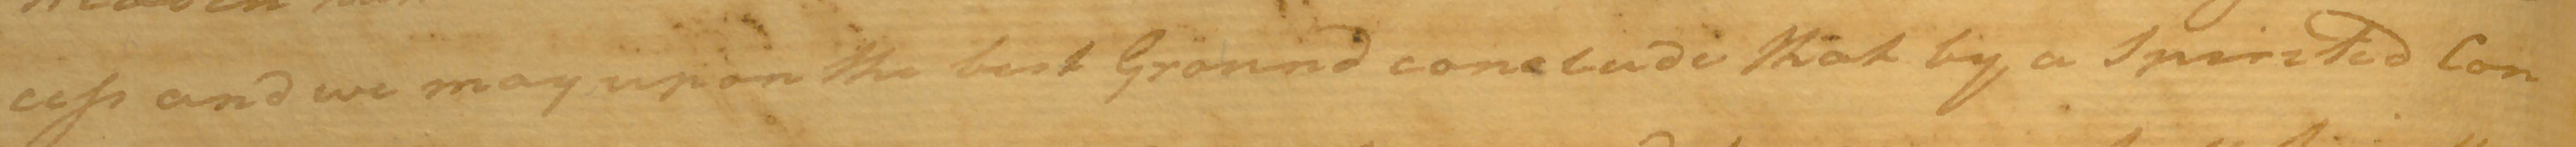cess and we may upon the best Ground conclude that by a spirited Con
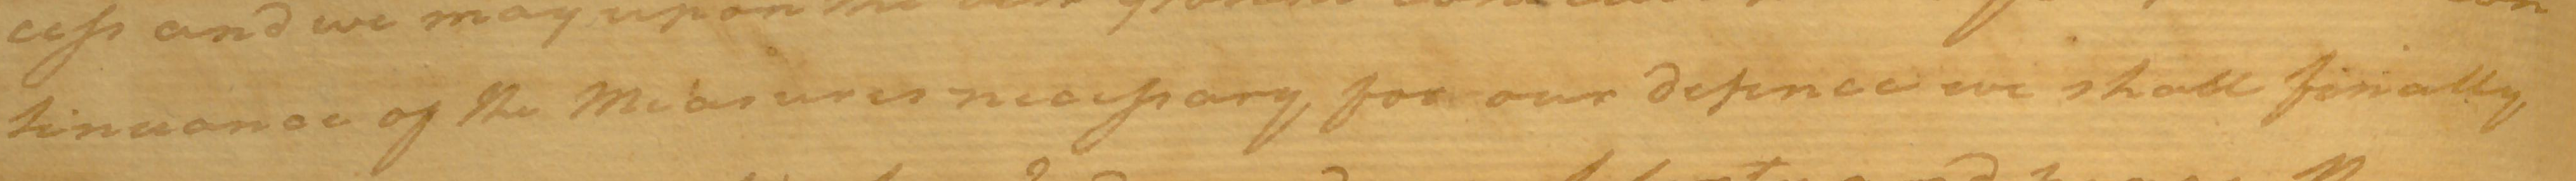tinuance of the Measures necessary for our defence we shall finally
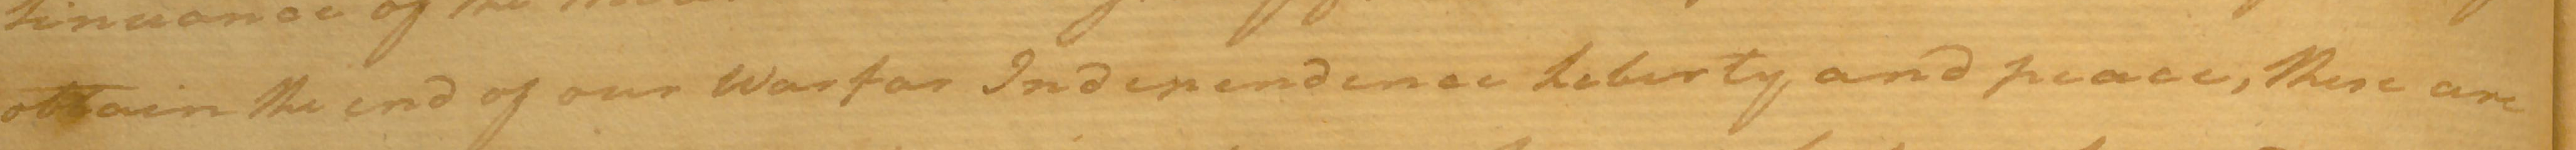obtain the end of our War for Independence Liberty and peace, there are
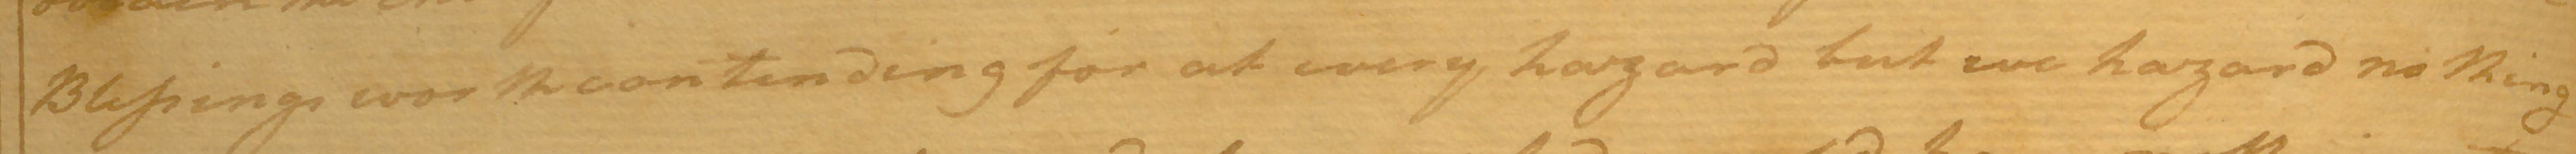Blessings worth contending for at every hazard but we hazard nothing
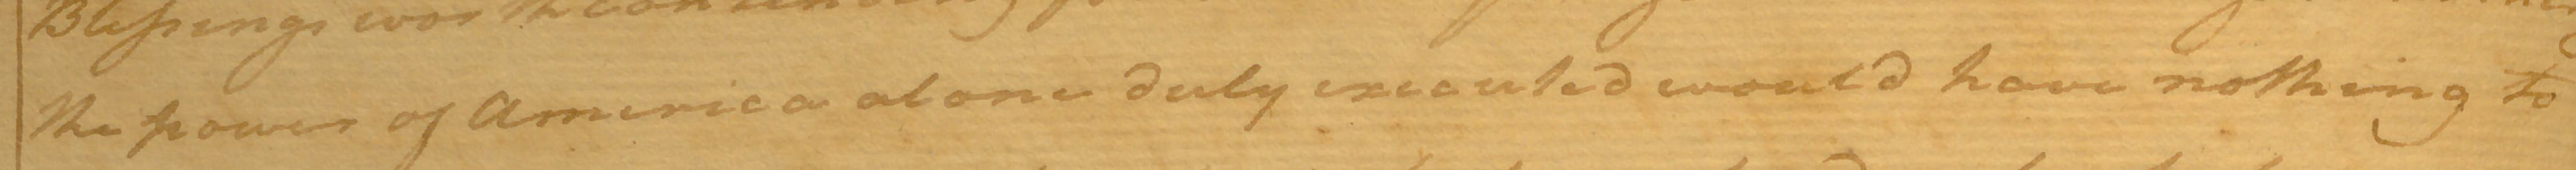the power of America alone duly executed would have nothing to
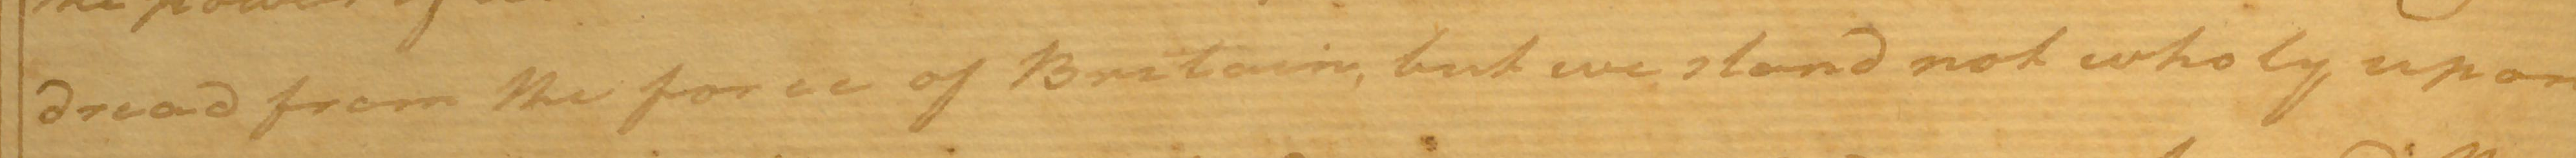dread from the force of Britain, but we stand not wholy upon
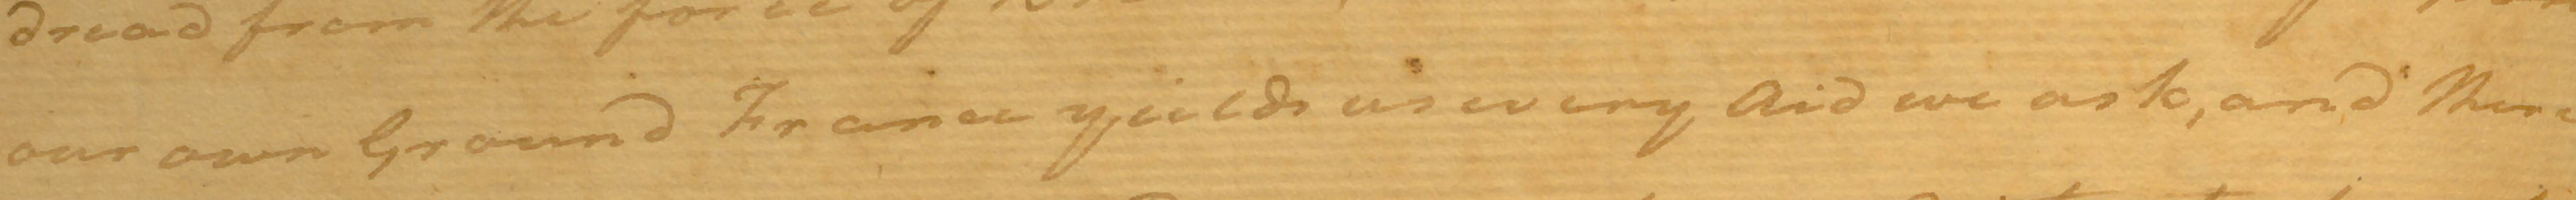our own Ground France yields us every Aid we ask, and there
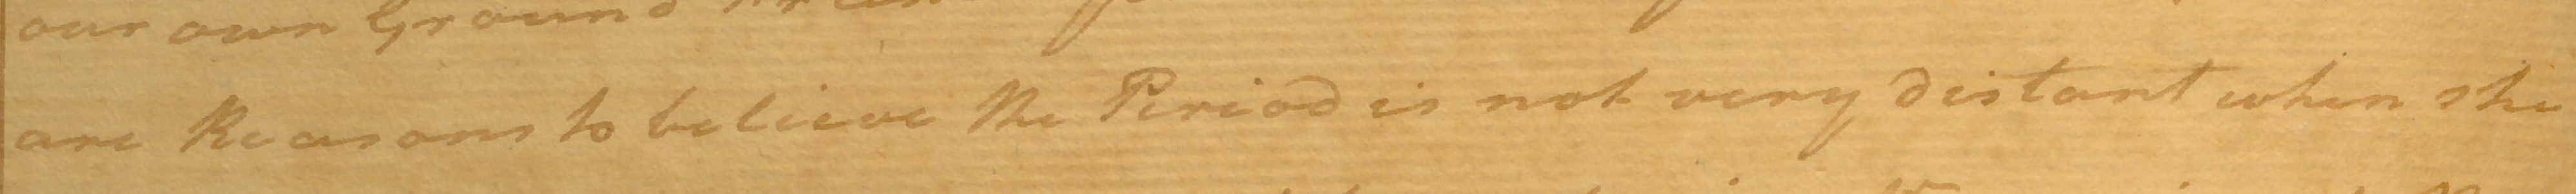are Reasons to believe the Period is not very distant when she
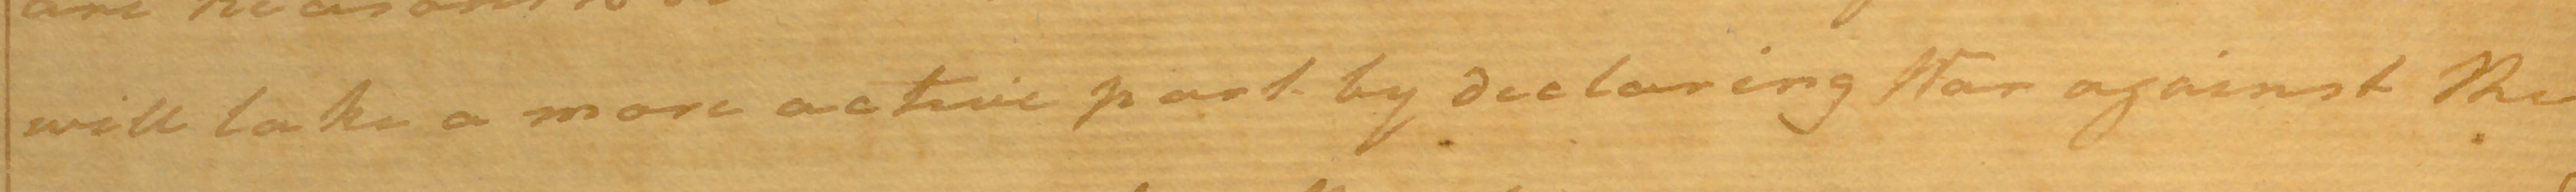will take a more active part by declaring War against the
